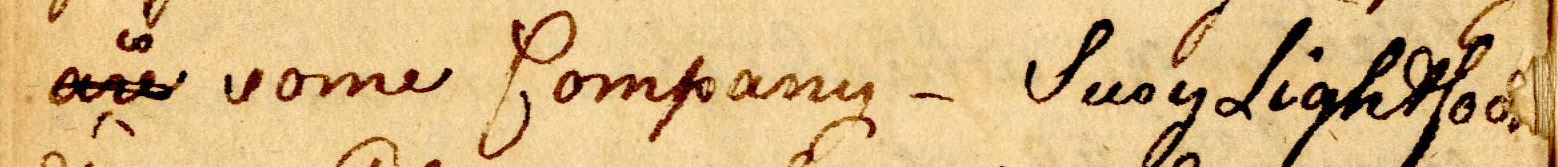[are] some Company- Susy Lightfoot
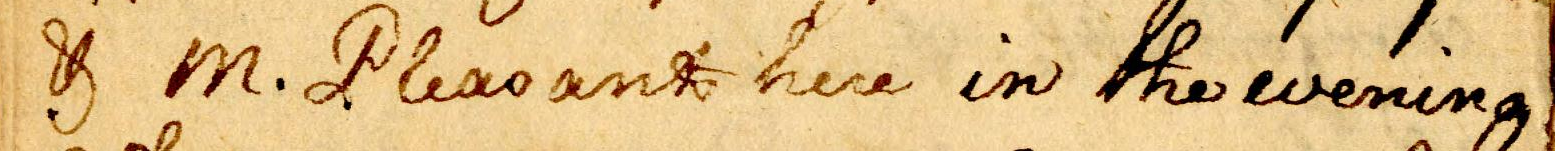& M. Pleasants here in the evening
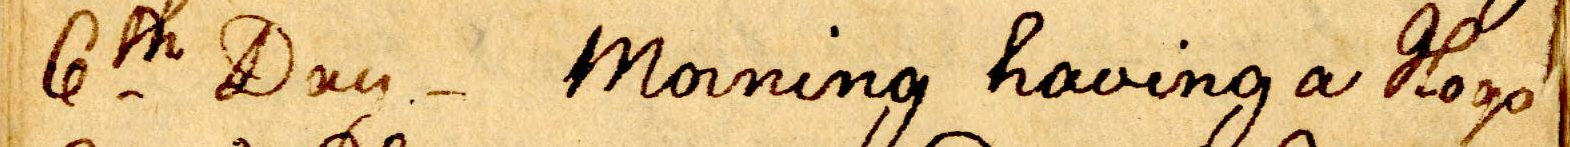6^th Day- Morning having a Hogs
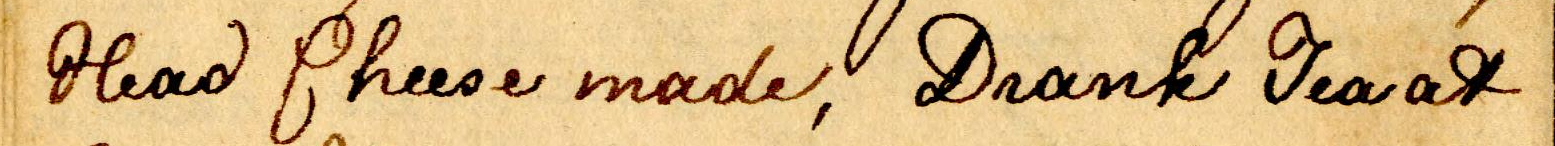Head Cheese made, Drank Tea at
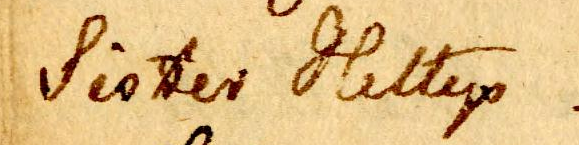Sister Hettys-
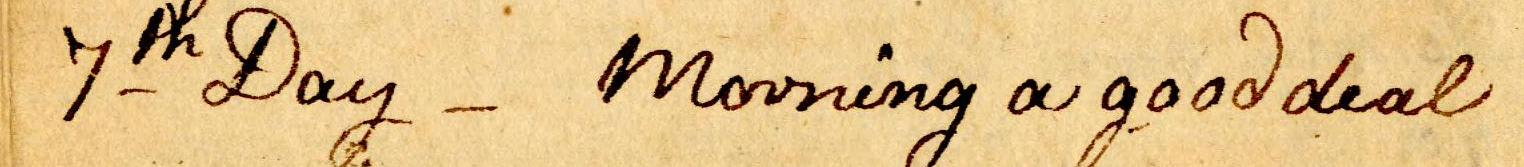7^h Day- Morning a good deal
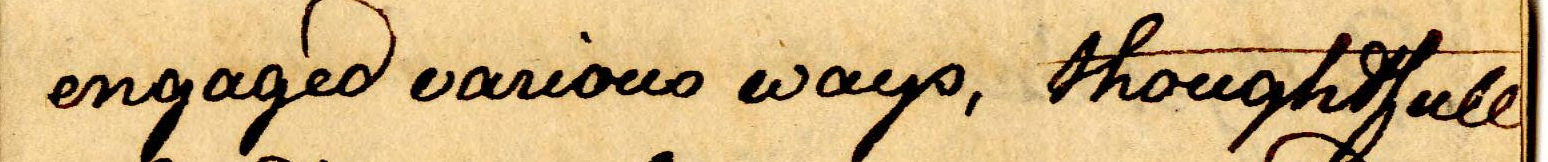engaged various ways, thoughtfull
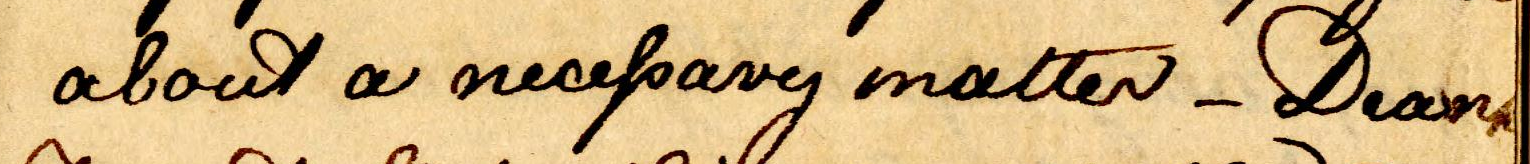about a necessary matter- Drank
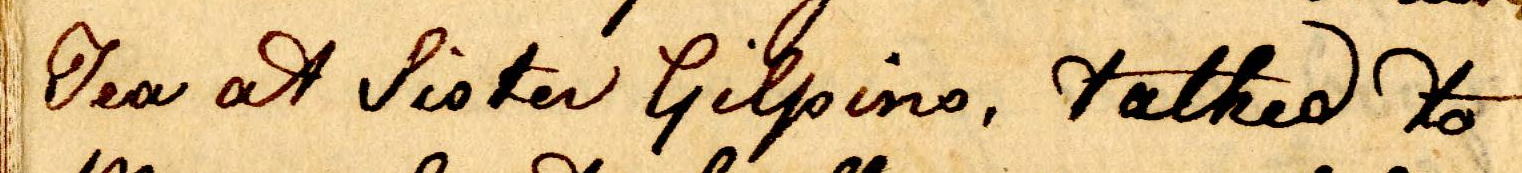Tea at Sister Gilpins, talked to
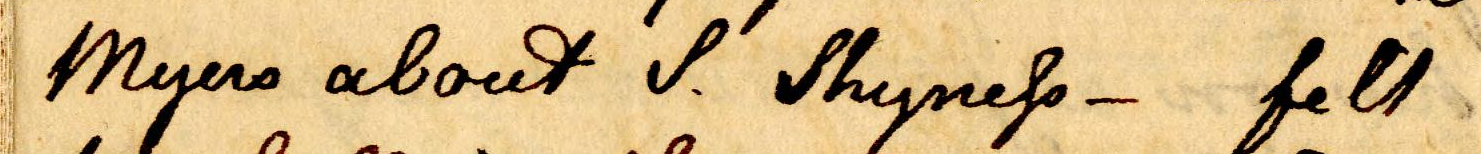Myers about S. Shyness- felt
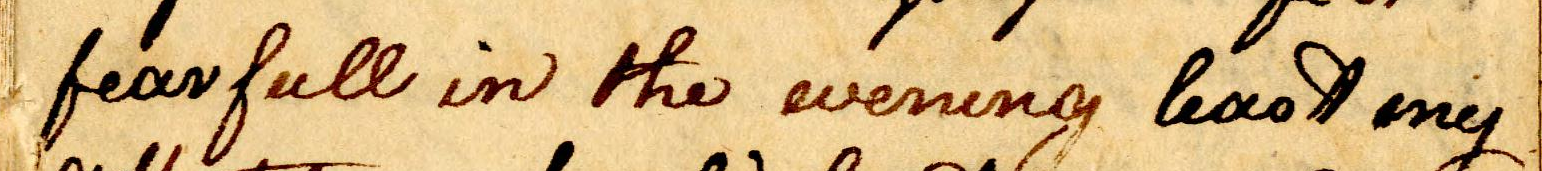fearfull in the evening least my
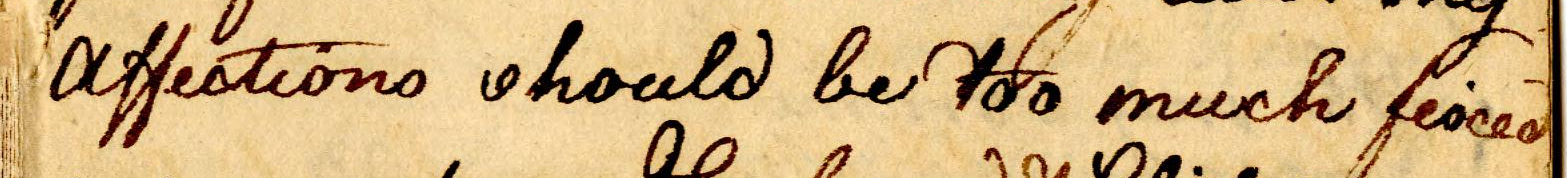Affections should be too much fixed
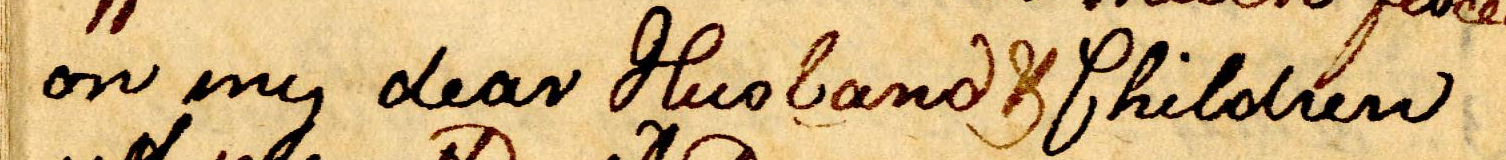on my dear Husband & Children
